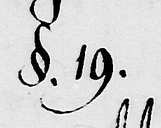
§.19.
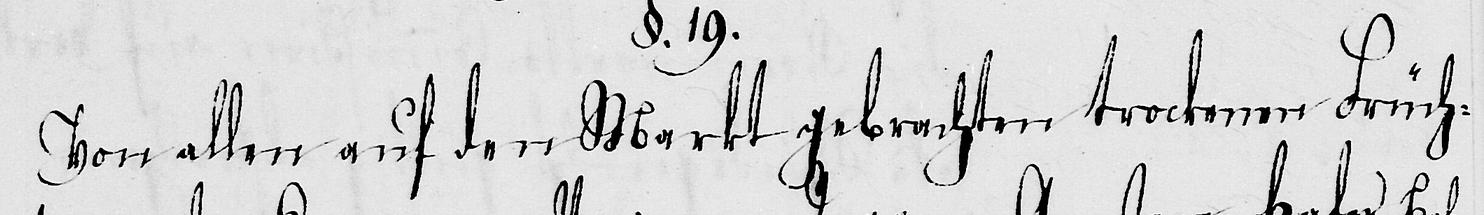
Von allen auf den Markt gebrachten trockenen Früch¬
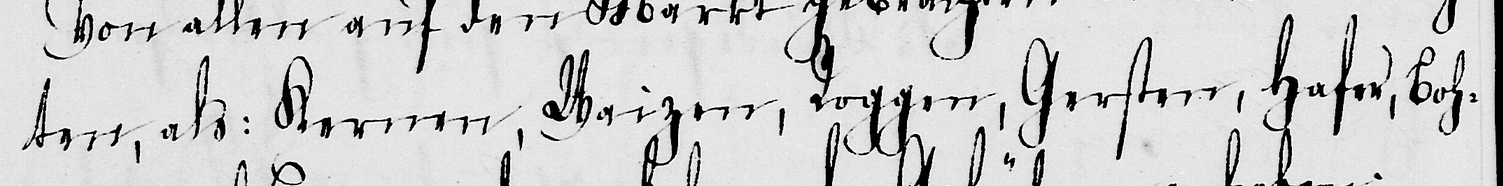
ten, als: Kernen, Waizen, Roggen, Gersten, Hafer, Boh¬
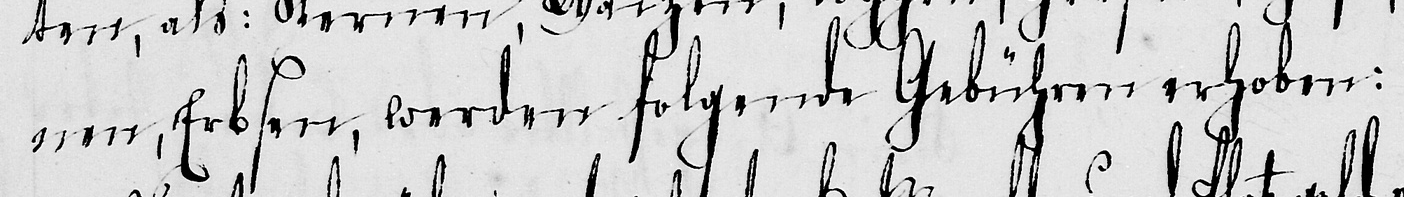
nen, Erbsen, werden folgende Gebühren erhoben:
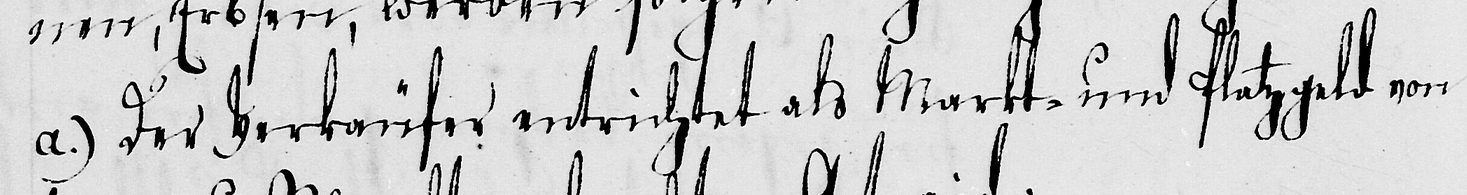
a.) Der Verkäufer entrichtet als Markt- und Platzgeld von
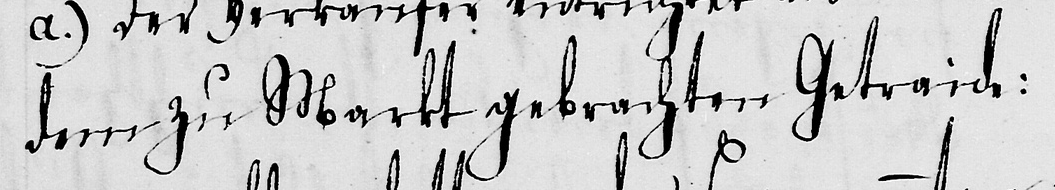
dem zu Markt gebrachten Getraide:
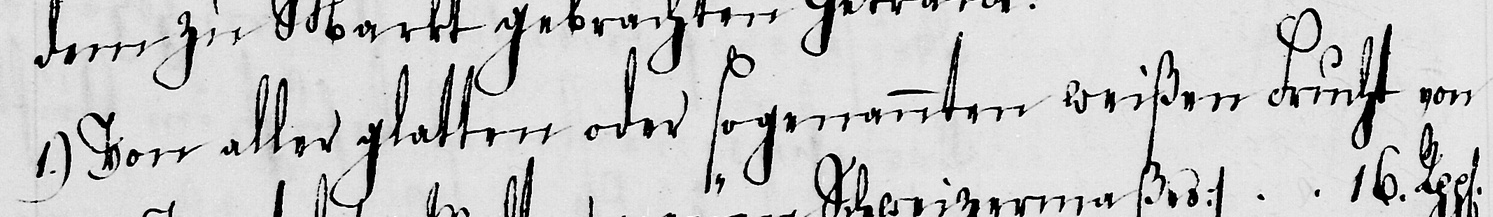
1.) Von aller glatten oder sogenannten weißen Frucht von
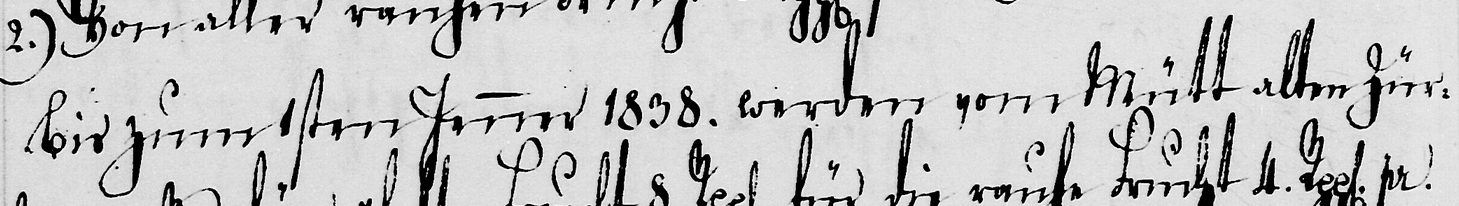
Bis zum 1sten Jenner 1838. werden vom Mütt alten Zür¬
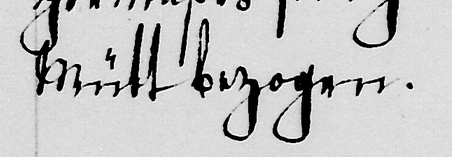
Mütt bezogen
